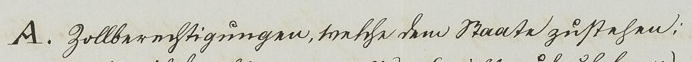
A. Zollberechtigungen, welche dem Staate zustehen:
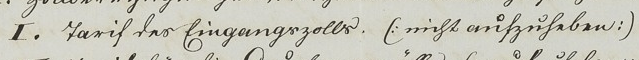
I. Tarif des Eingangszolls. (nicht aufzuheben)
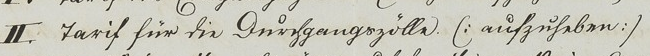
II. Tarif für die Durchgangszölle. (aufzuheben)
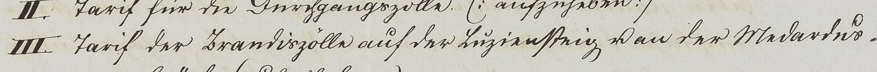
III. Tarif der Brandiszölle auf der Luziensteig & an der Medardus-
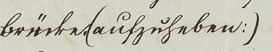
brücke. (aufzuheben)
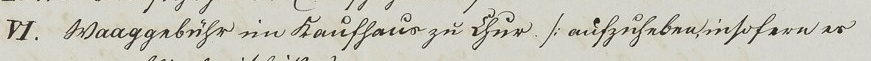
VI. Waaggebühr im Kaufhaus zu Chur. (aufzuheben, insofern es
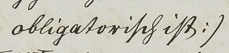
obligatorisch ist)
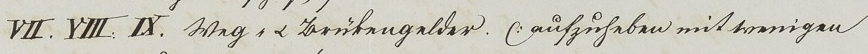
VII. VIII. IX. Weg- & Brükengelder. (aufzuheben mit wenigen
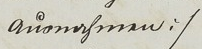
Ausnahmen)
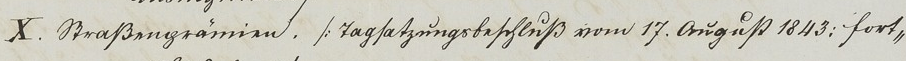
X. Straßenprämien. (Tagsatzungsbeschluß vom 17. August 1843: fort-
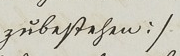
zubestehen)
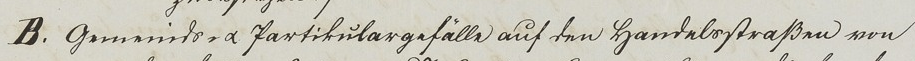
B. Gemeinds- & Partikulargefälle auf den Handelsstraßen von
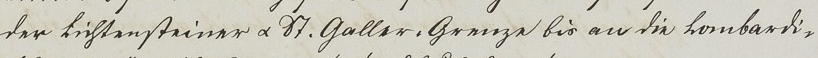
der Lichtensteiner & St. Galler-Grenze bis an die Lombardi-
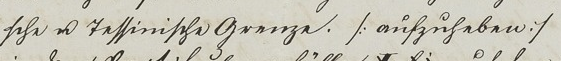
sche & Tessinische Grenze. (aufzuheben)
